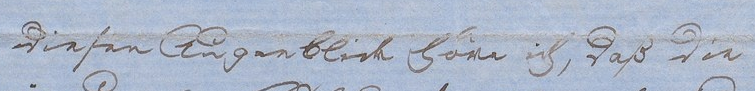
Diesen Augenblick höre ich, daß die
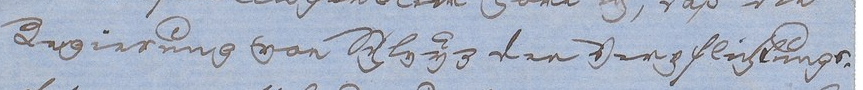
Regierung von Schwyz den Verpflichtungs-
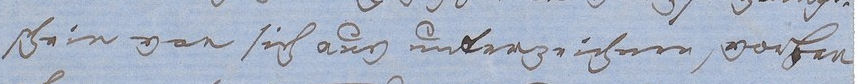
schein von sich aus unterzeichnen, vorher
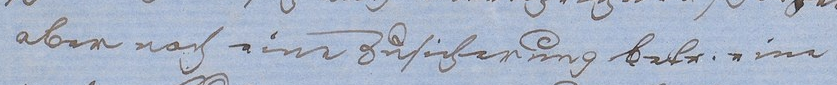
aber noch eine Zusicherung betr. eine
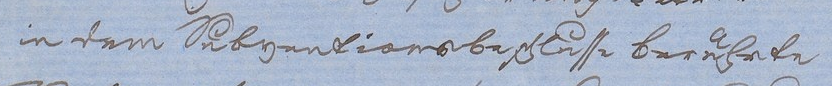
in dem Subventionsbeschlusse berührte
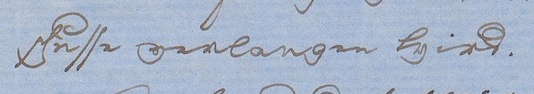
schusse verlangen wird.
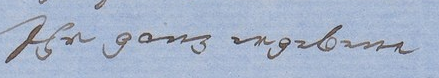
Ihr ganz ergebene
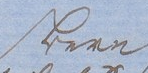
Bern
